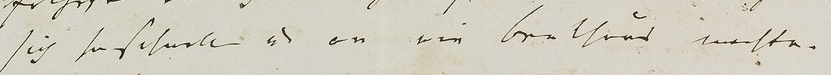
sich so schnell u. an ein Bankhaus machte.
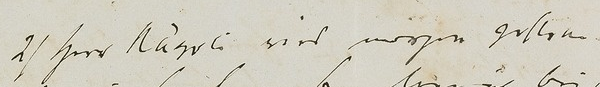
2) Herr Nägeli wird morgen zahlen.
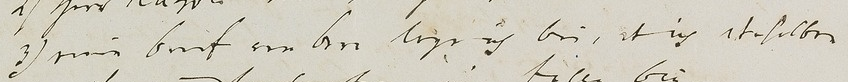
3) einen Brief von Bern lege ich bei, da ich denselben
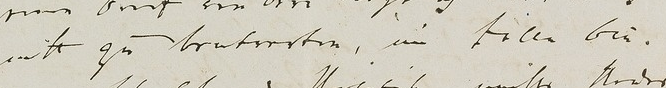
nicht zu beantworten, im Falle bin.
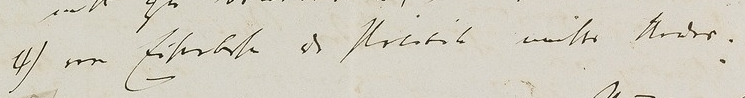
4) von Eisenbahn u. Politik nichts Neues.
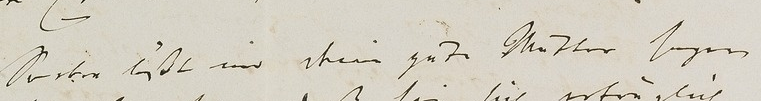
So eben läßt mir deine gute Mutter sagen,
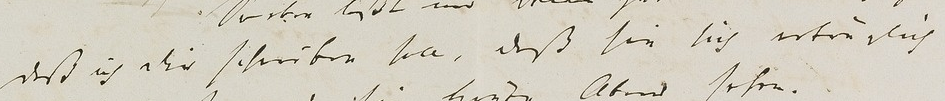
daß ich dir schreiben soll, daß sie sich erträglich
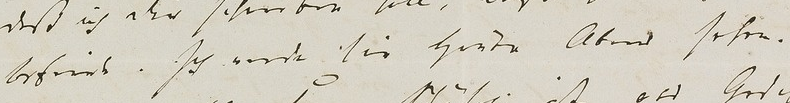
befinde. Ich werde sie heute Abend sehen.
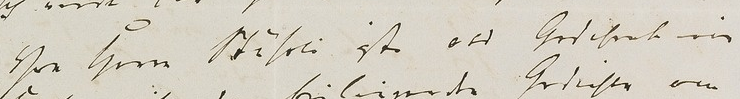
Von Herrn Stäheli ist als Geschenk ein
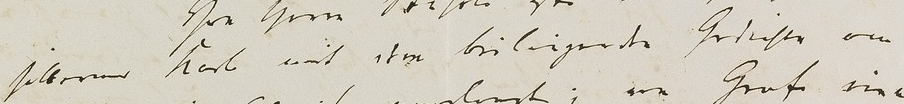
silberner Korb mit dem beiliegenden Gedichte am
